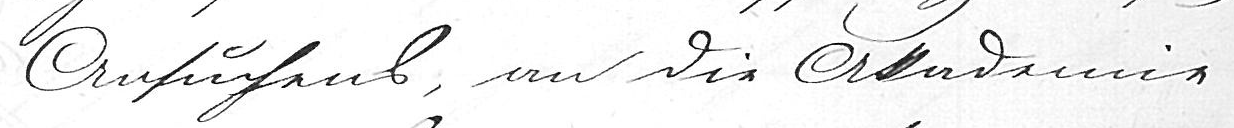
Ansuchens, an die Akademie
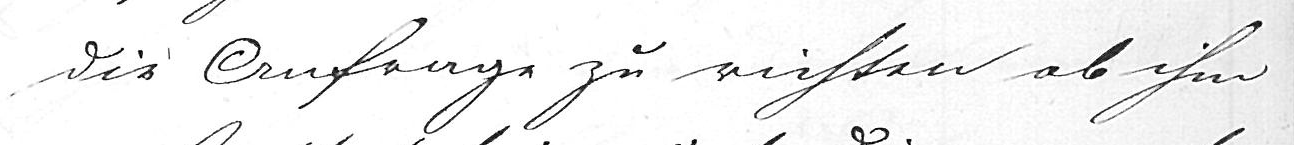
die Anfrage zu richten ob ihm
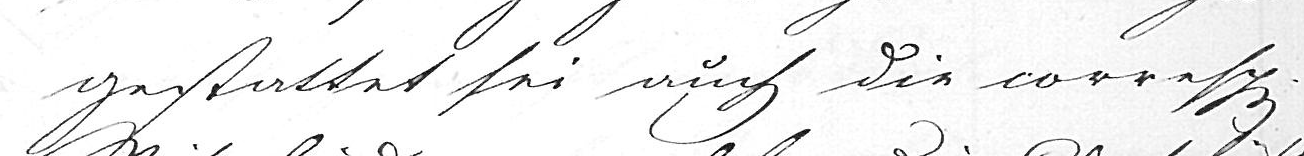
gestattet sei auch die correspon.
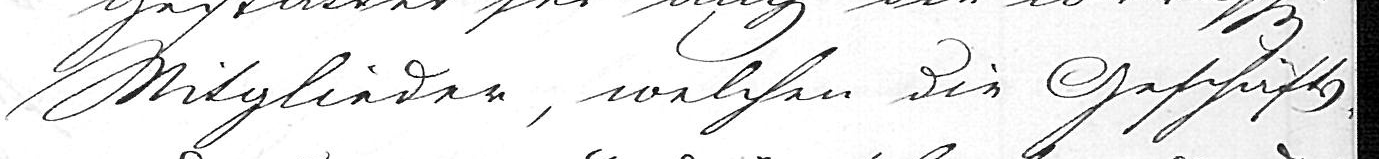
Mitglieder, welchen die Geschäfts-
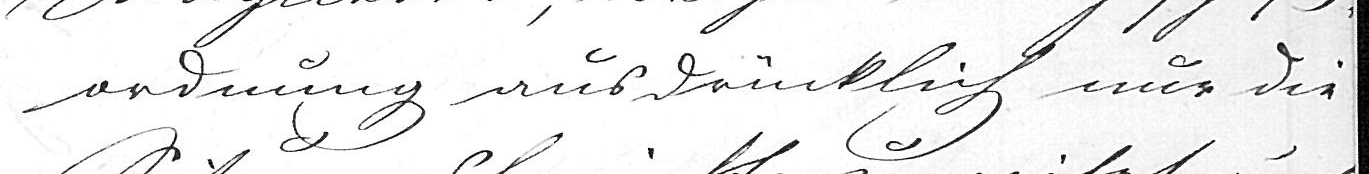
ordnung ausdrücklich nur die
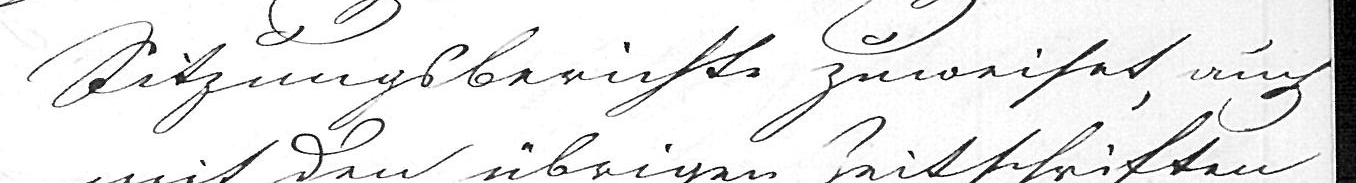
Sitzungsberichte zuweiset, auch
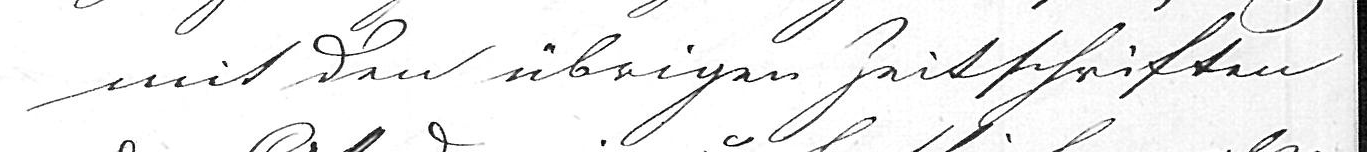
mit den übrigen Zeitschriften
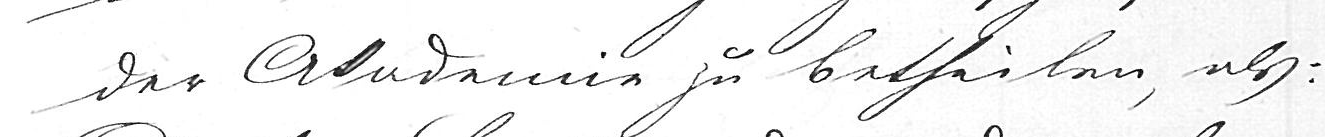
der Akademie zu betheilen, als
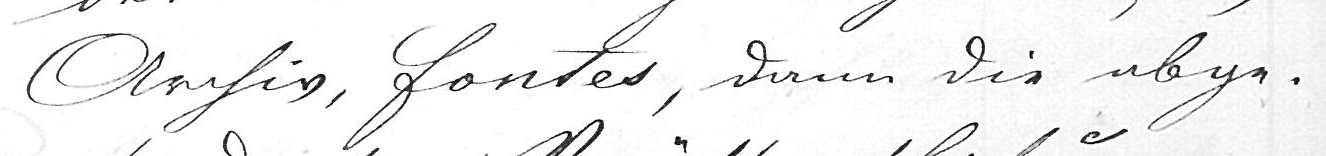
Archiv, Fontes, dann die abge-
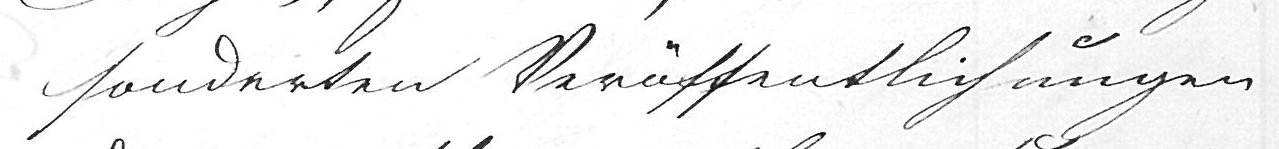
sonderten Veröffentlichungen
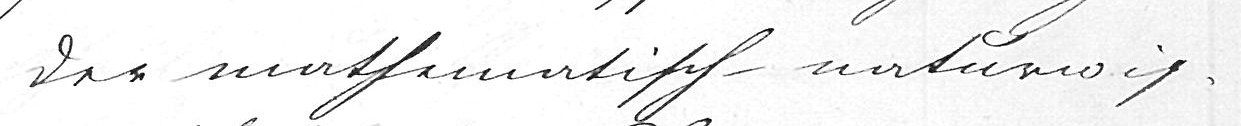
der mathematisch-naturwis-
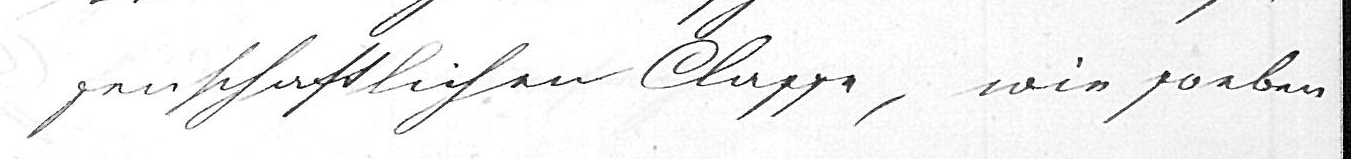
senschaftlichen Classe, wie soeben
